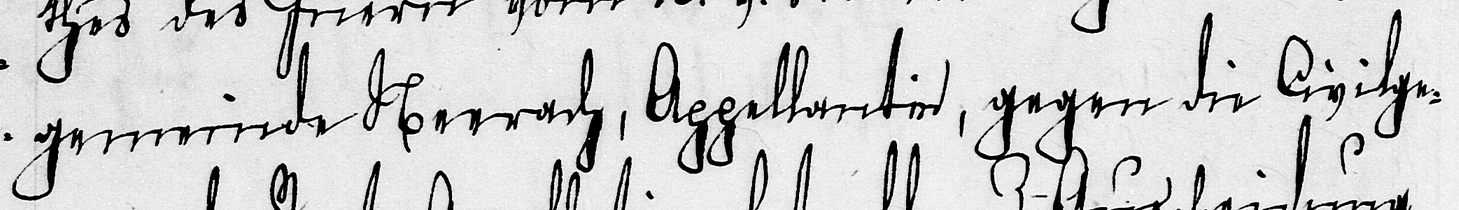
gemeinde Neerach, Appellantin, gegen die Civilge¬
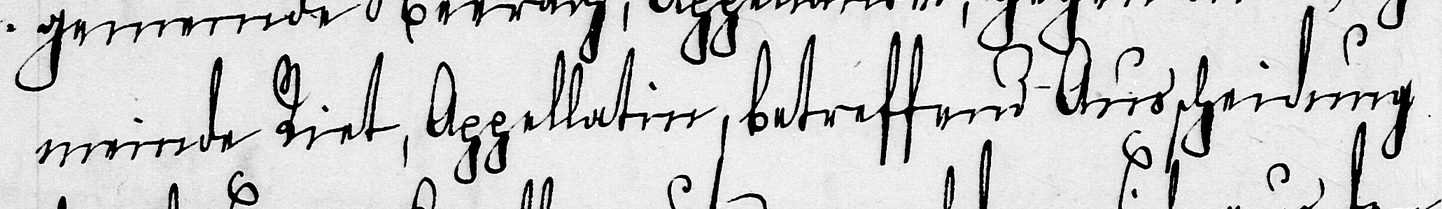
meinde Riet, Appellatin, betreffend Ausscheidung
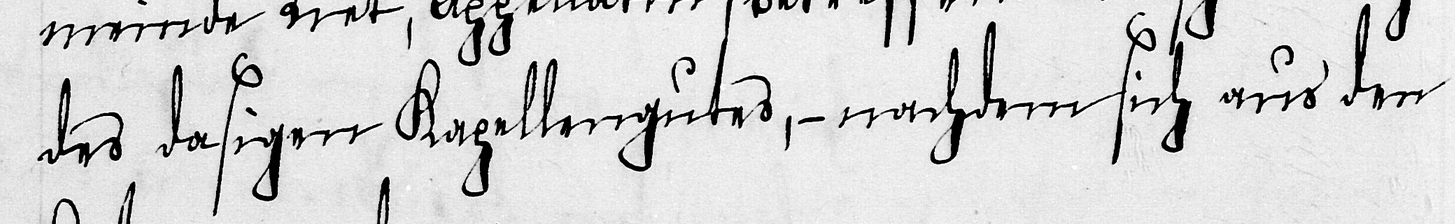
des dasigen Kappellengutes, – nachdem sich aus den
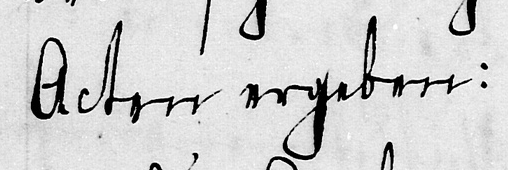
Acten ergeben:
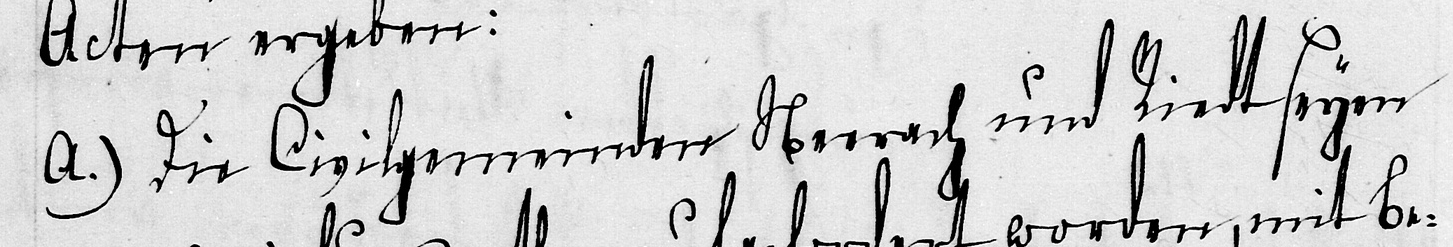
A.) Die Civilgemeinden Neerach und Riedt seyen
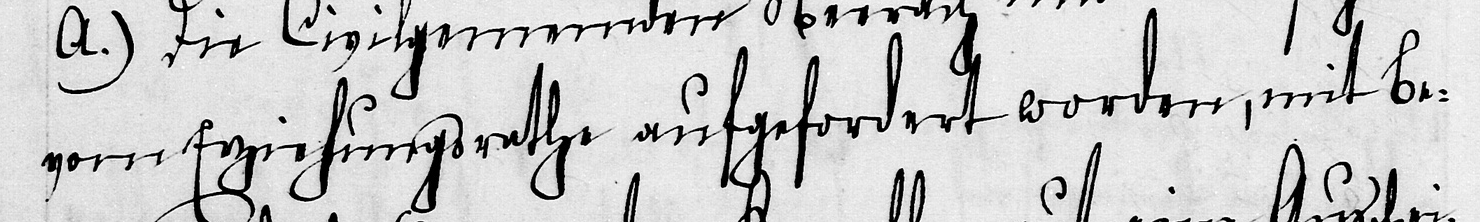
vom Erziehungsrathe aufgefordert worden, mit Be¬
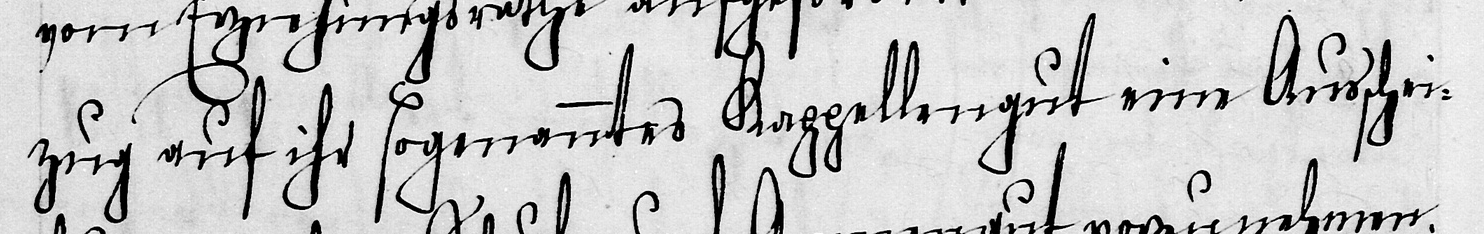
zug auf ihr sogenanntes Kappellengut eine Ausschei¬
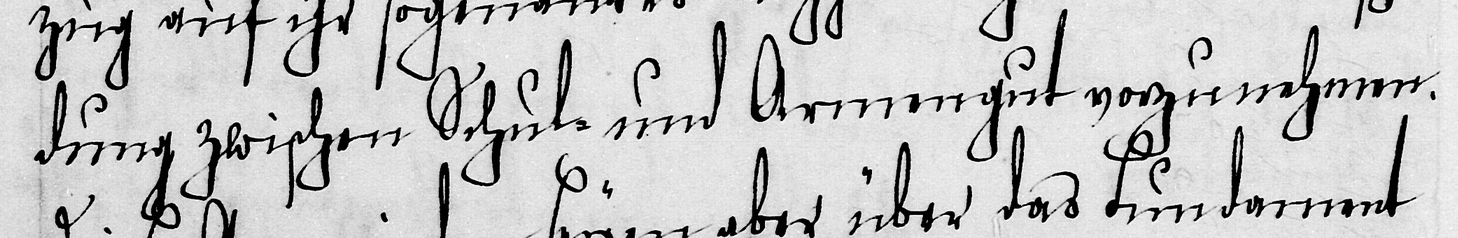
dung zwischen Schul- und Armengut vorzunehmen.
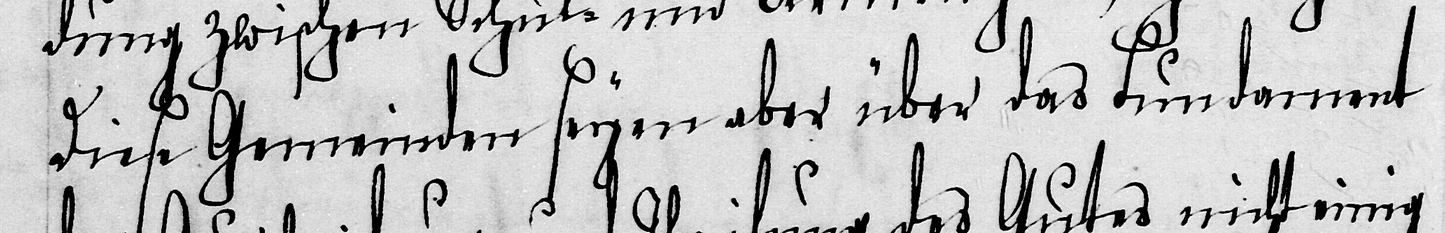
Diese Gemeinden seyen aber über das Fundament
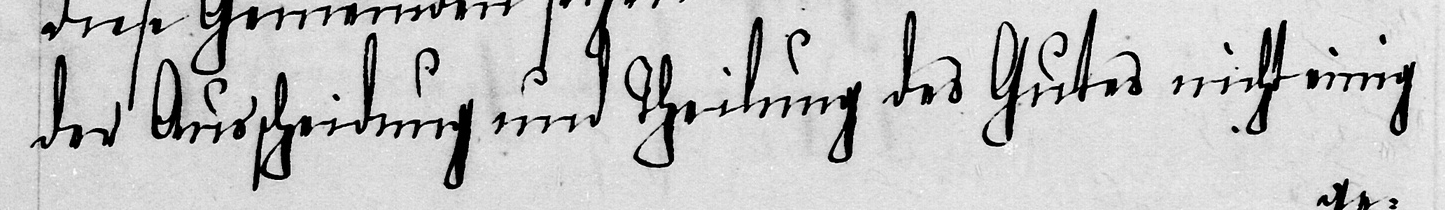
der Ausscheidung und Theilung des Gutes nicht einig
